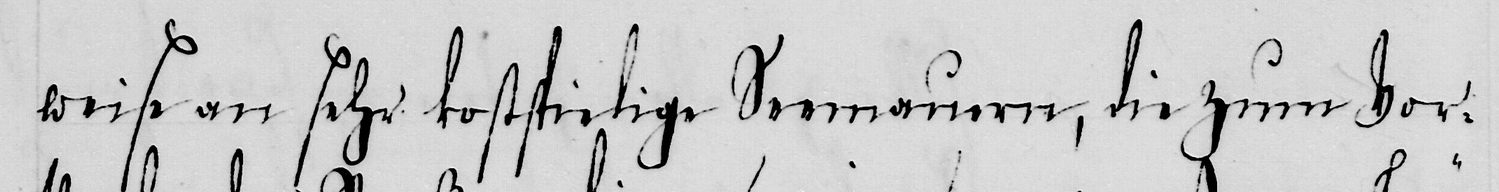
weise an sehr kostspielige Seemauern, die zum Vor¬
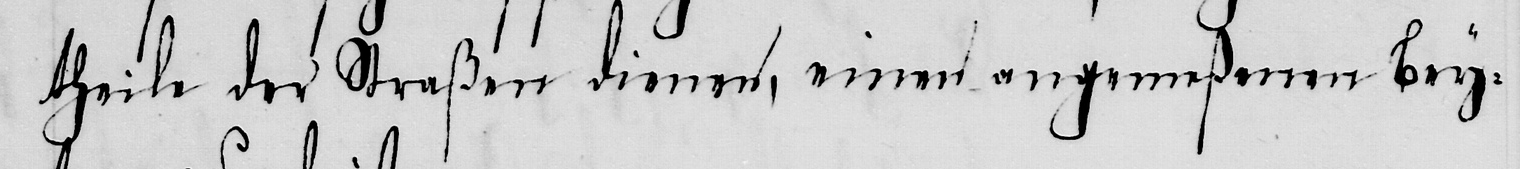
theile der Straßen dienen, einen angemeßenen Bey¬
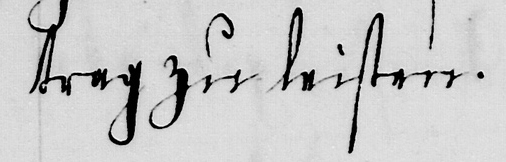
trag zu leisten.
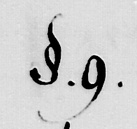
§. 9.
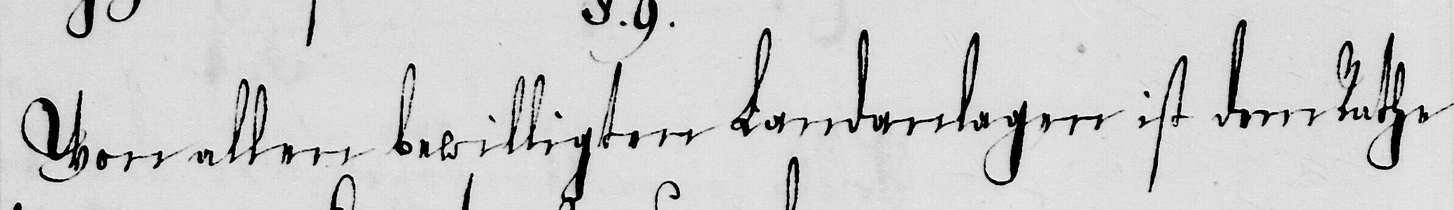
Von allen bewilligten Landanlagen ist dem Rathe
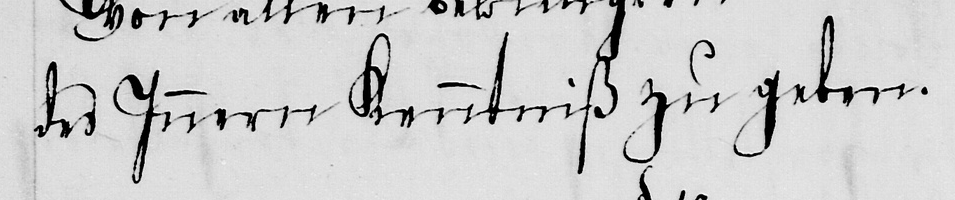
des Innern Kenntniß zu geben.
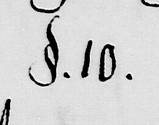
§. 10.
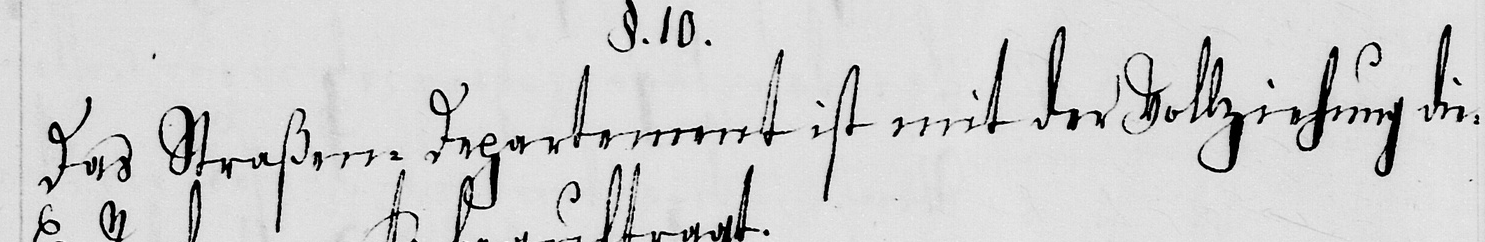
Das Straßen-Departement ist mit der Vollziehung di¬
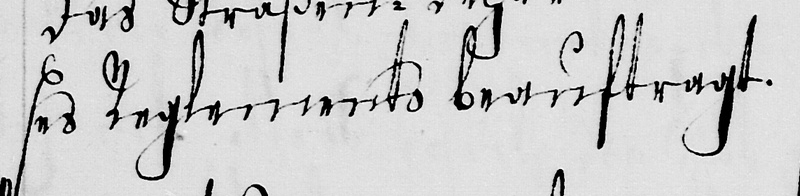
ses Reglements beauftragt.
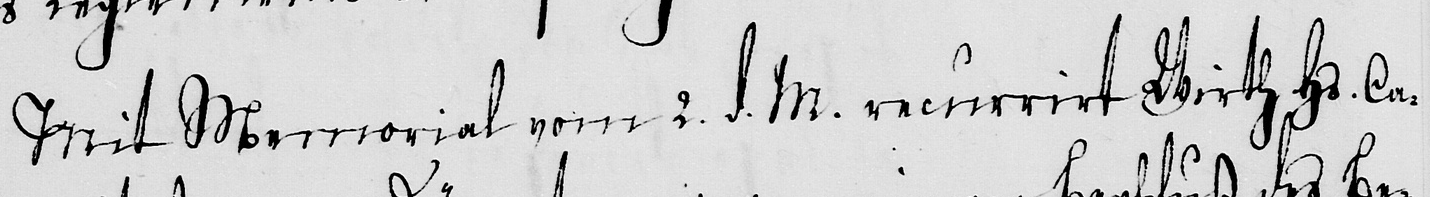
Mit Memorial vom 2. d. M. recurrirt Wirth Hs. Ca¬
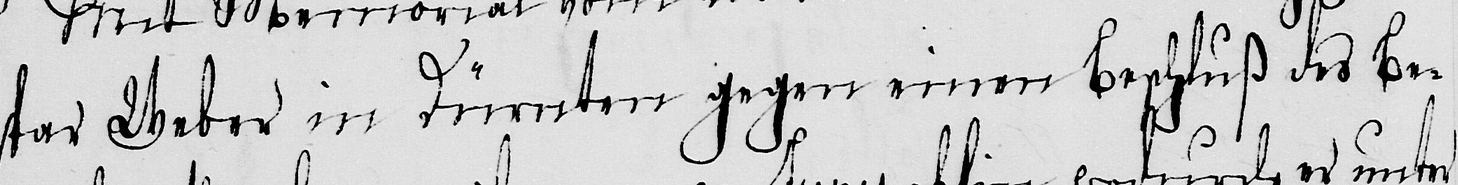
par Weber in Dürnten gegen einen Beschluß des Be¬
